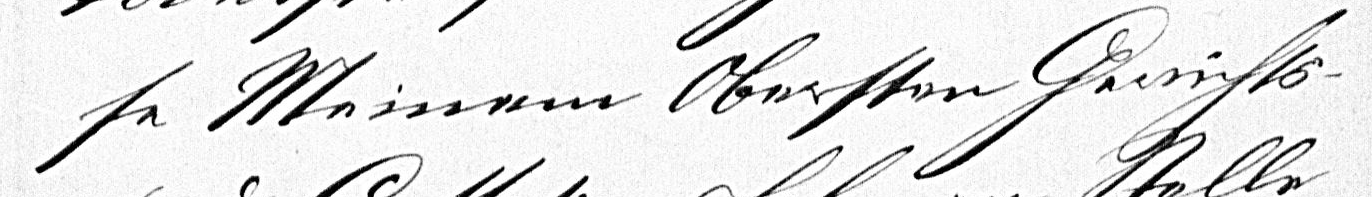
se Meinem Oberster Gerichts-
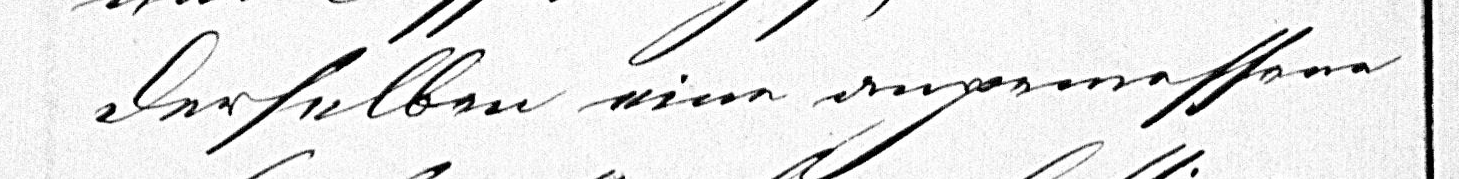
Derselben eine angemessene
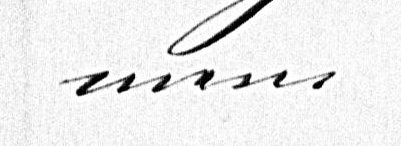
men.
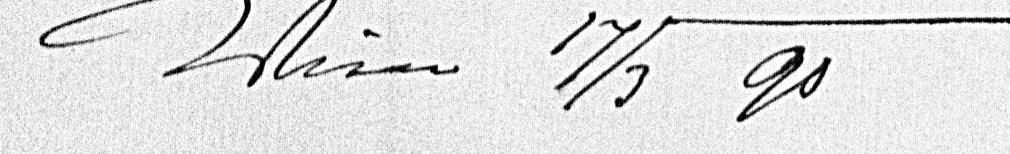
Wein 17/3 90
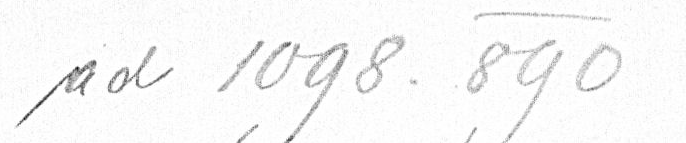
ad 1098. 890
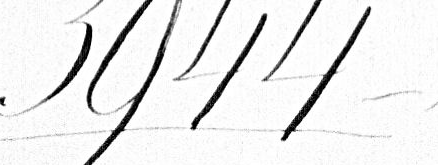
3944
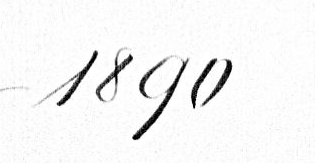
1890
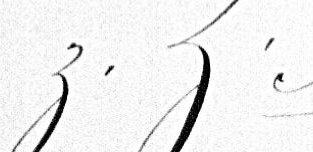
z. Z.
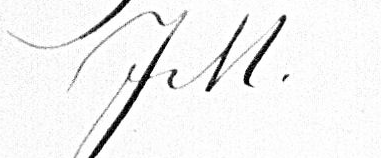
Jell.
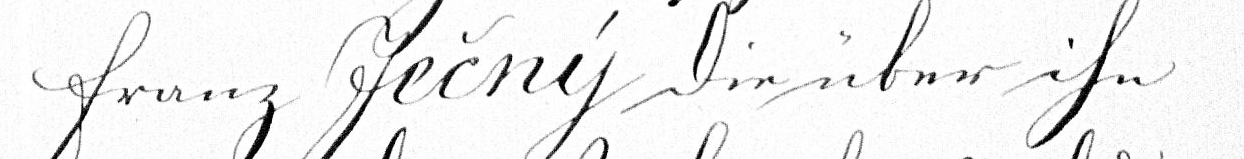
Franz Jecný die über ihn
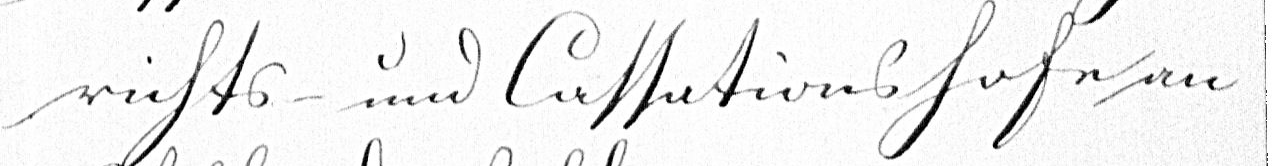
richts- und Cassations Hofe an
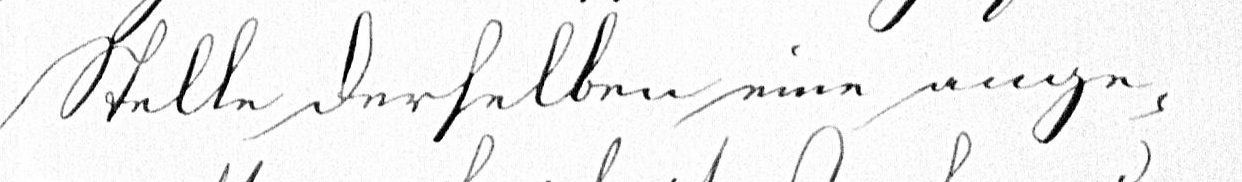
stelle derselben eine ange¬
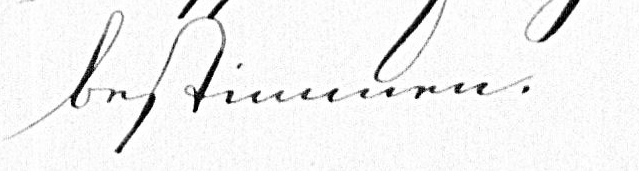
bestimmen.
